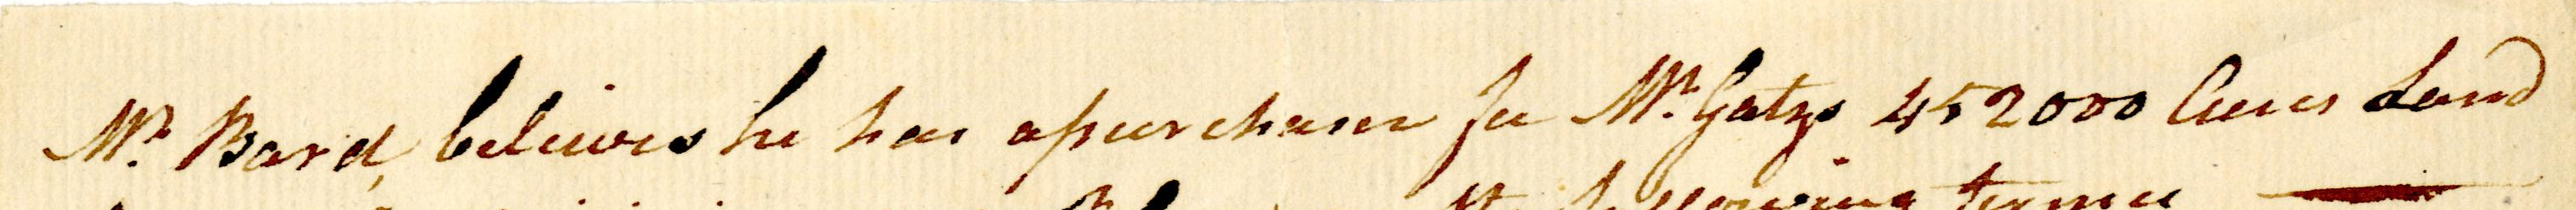M^r. Bard believes he has a purchaser for M^r. Gratzs 452000 Acres Land
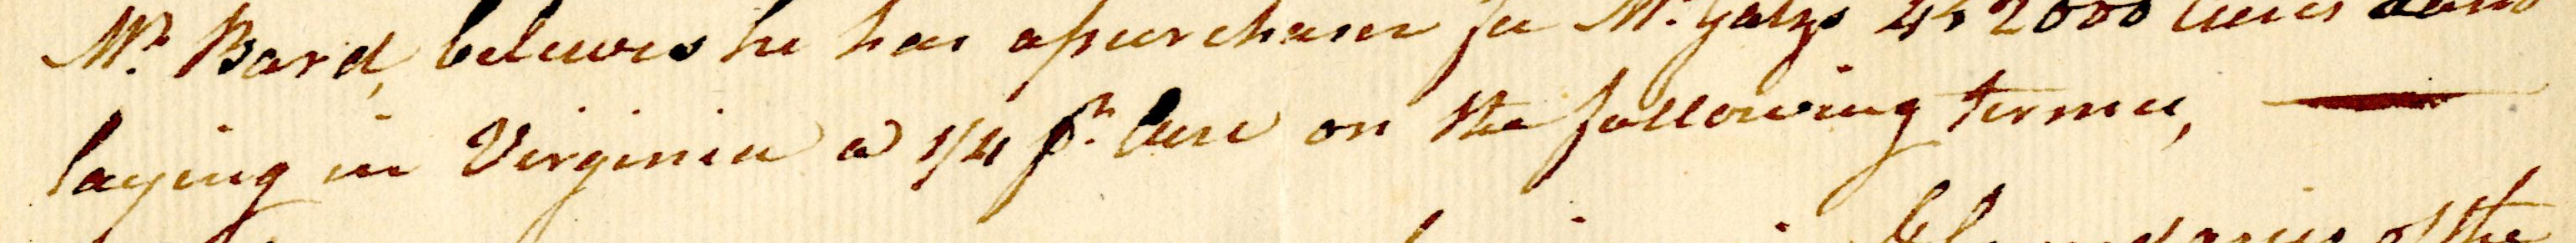laying in Virginia at 1/4 p^r. Acre on the following terms.-
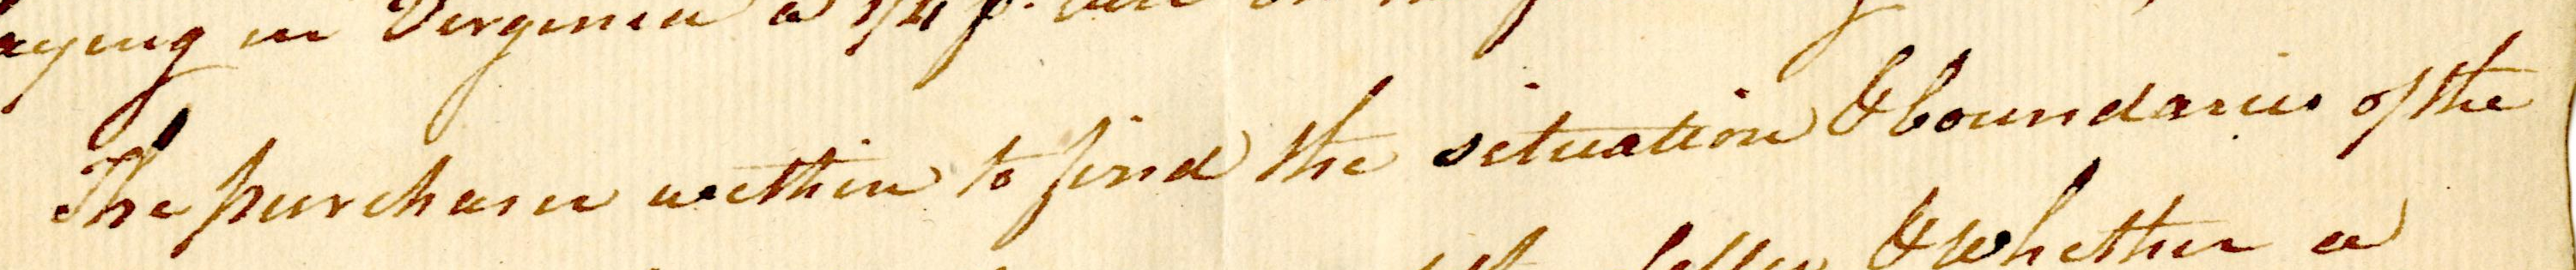The purchaser within to find the situation & boundaries of the
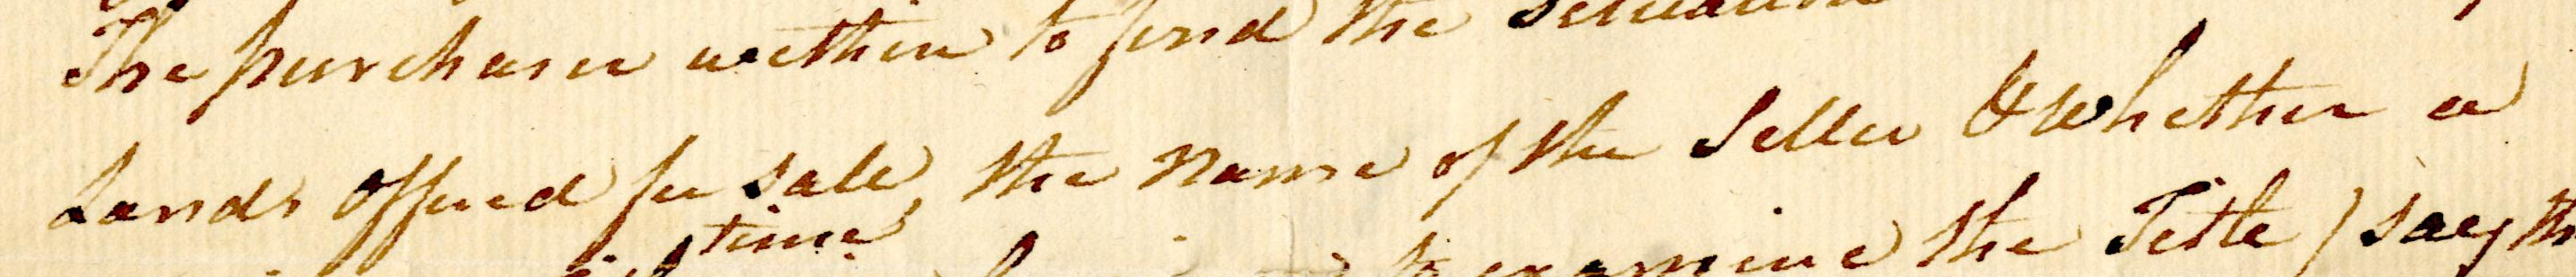Lands Offerd for sale the name of the Sale & whether a
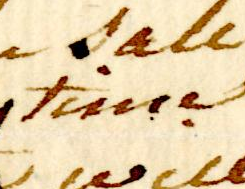time
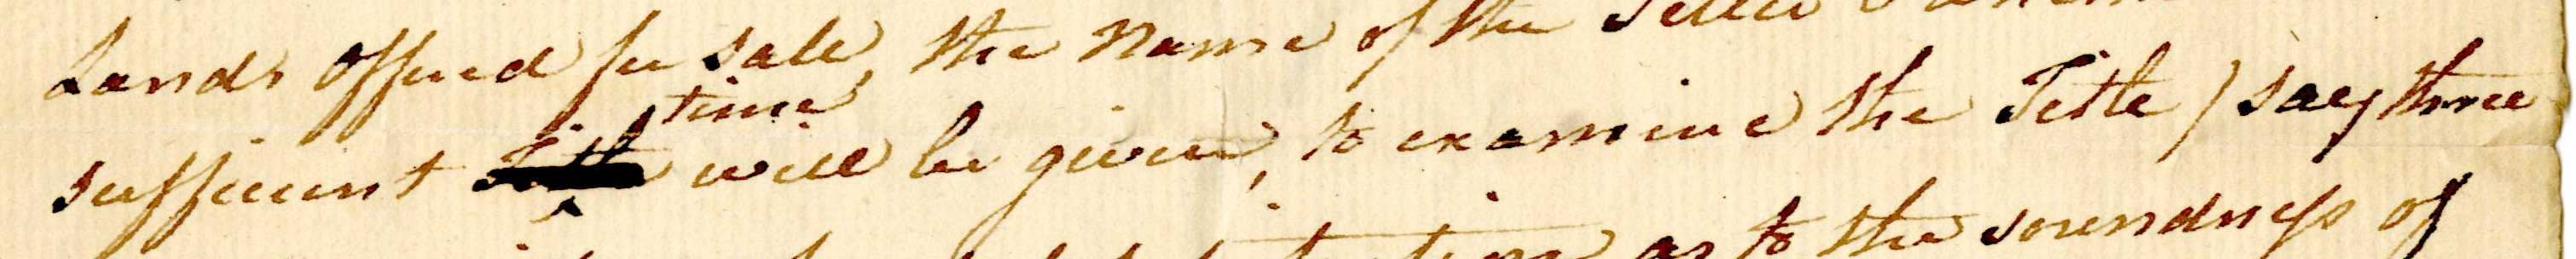sufficient [Title] ^ will be given to examine the Title (say three
